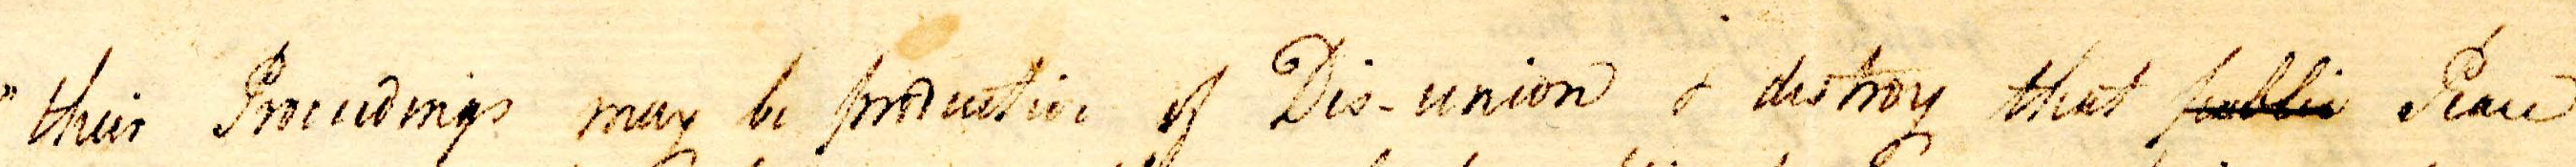"their Proceedings may be productive of Dis-union & destroy that public Peace
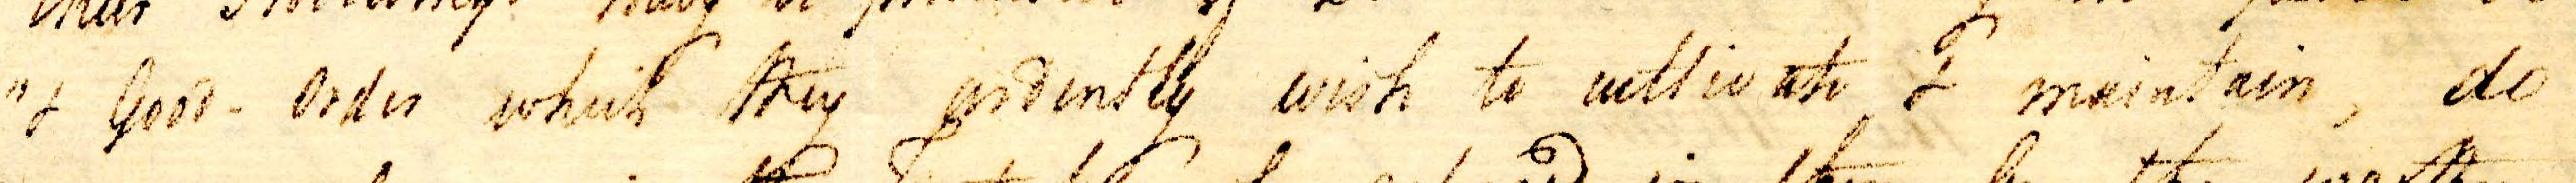"& Good-Order which they ardently wish to cultivate & maintain, de
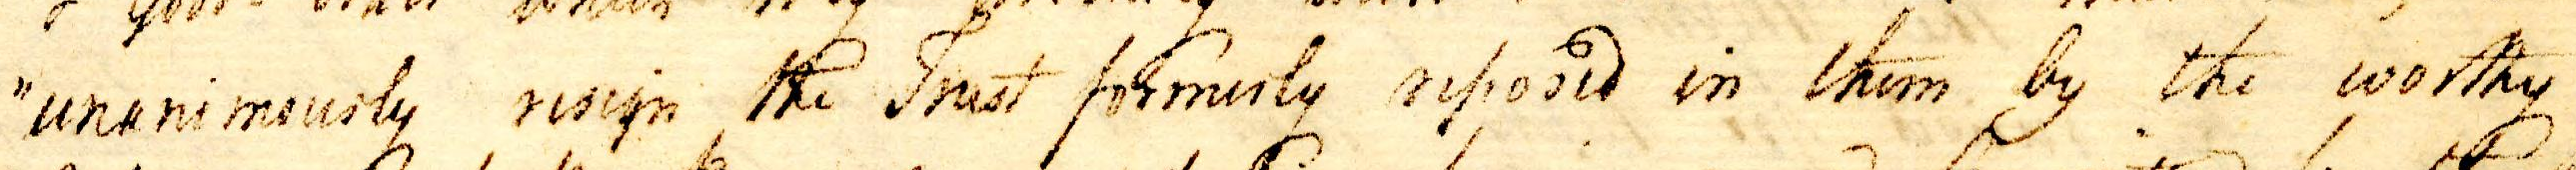unanimously resign the Trust formerly reposed in them by the worthy
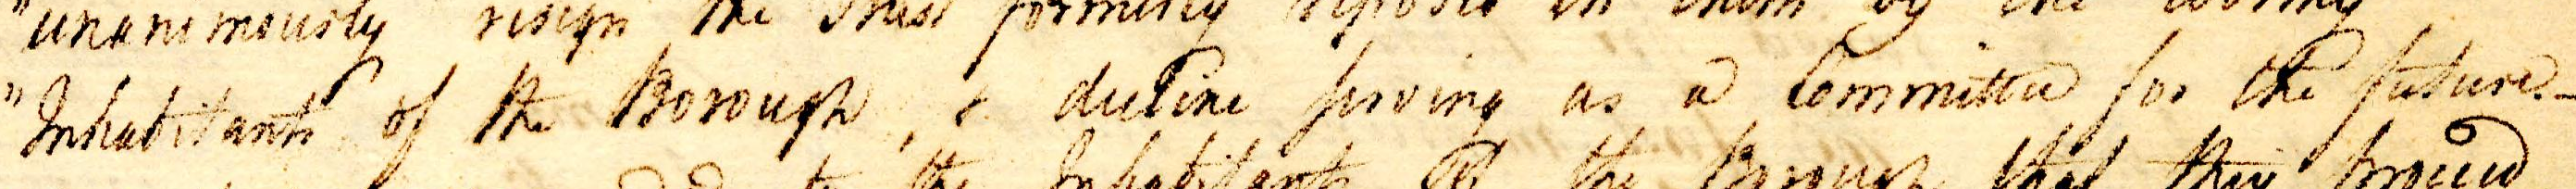"Inhabitants of the Borough, decline serving as a Committee for the future.
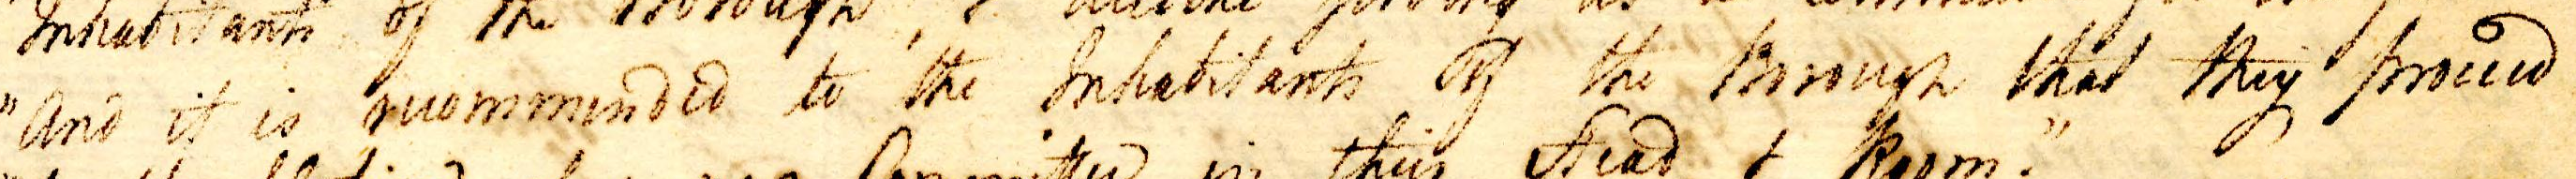"And it is recommended to the Inhabitants of the Borough that they proceed
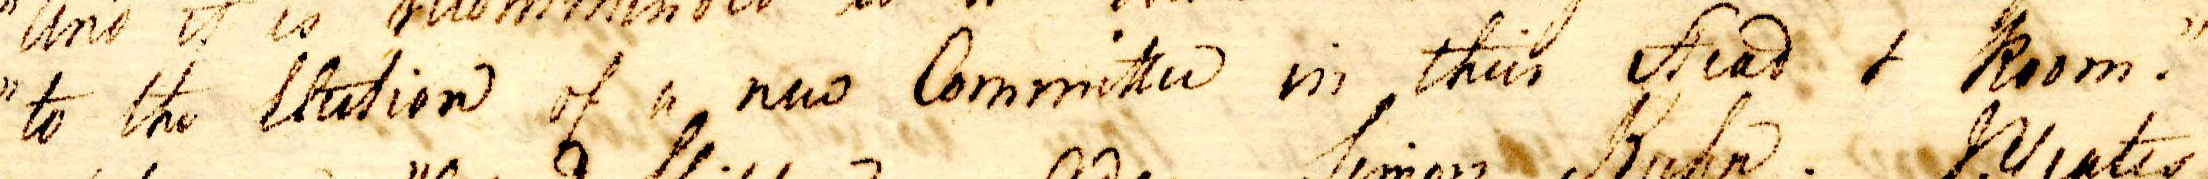"to the Elution of a new Committee in their Stead & Room."
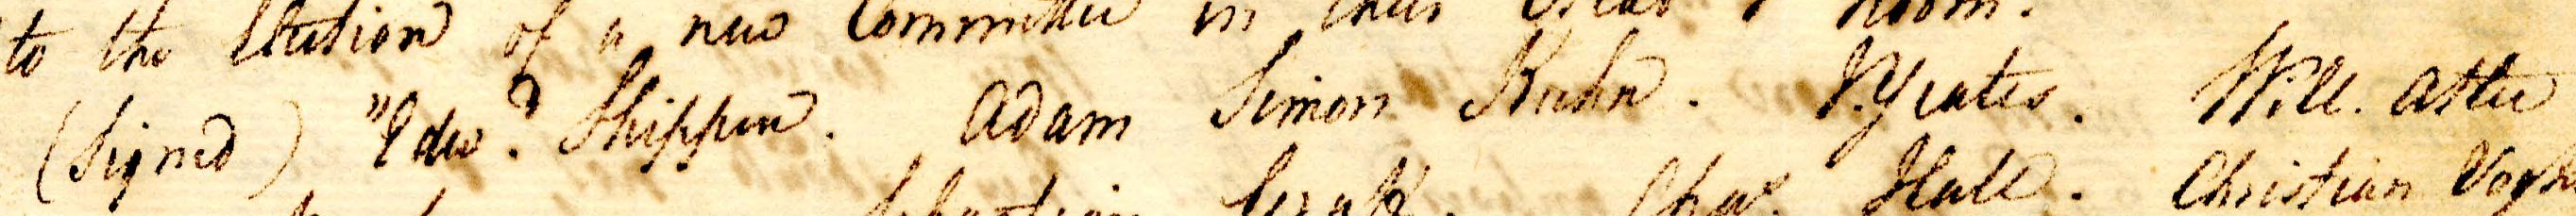(Signed) Edw^d. Shippen. Adam Simon Kuhn. J.Yeates. Will Attic.
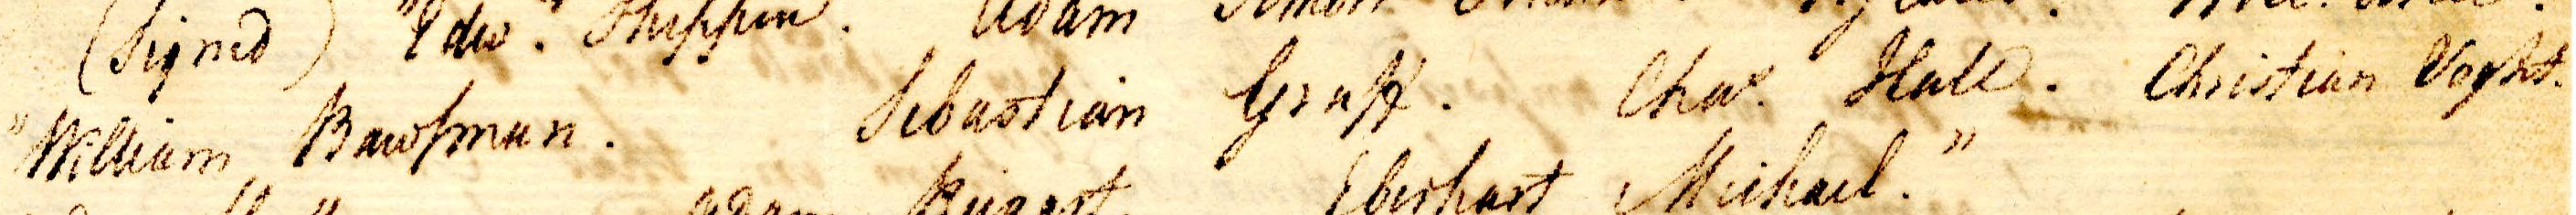Williams Bawfman. Sebastian Graff. Cha^s. Hall. Christian Voght.
